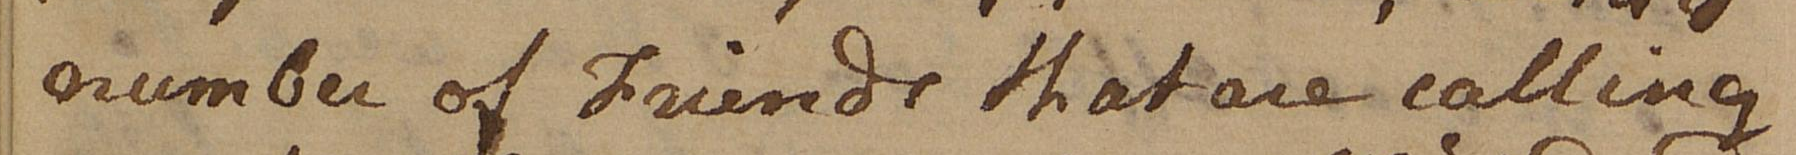number of Friends that are calling
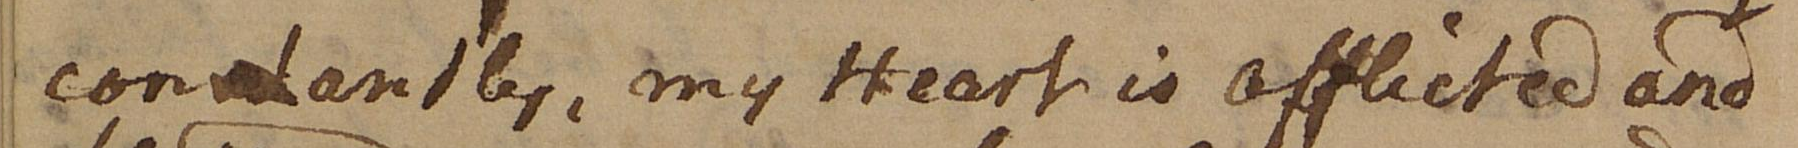constantly, my Heart is afflicted and
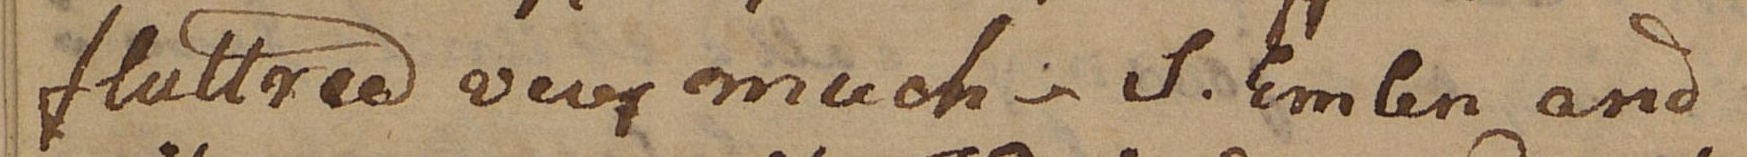fluttred very much- S. Emlen and
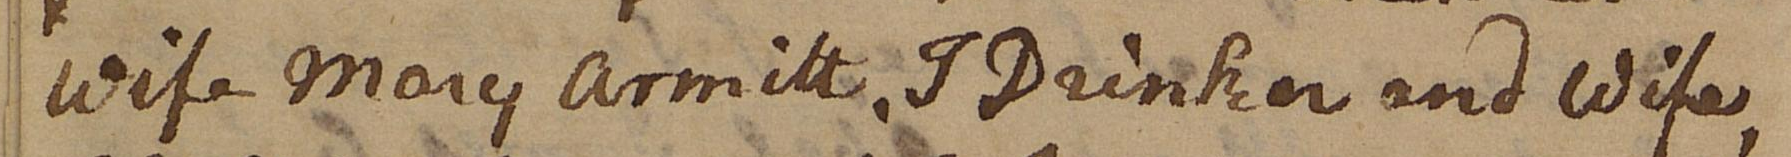wife Mary Armitt. J Drinker and wife,
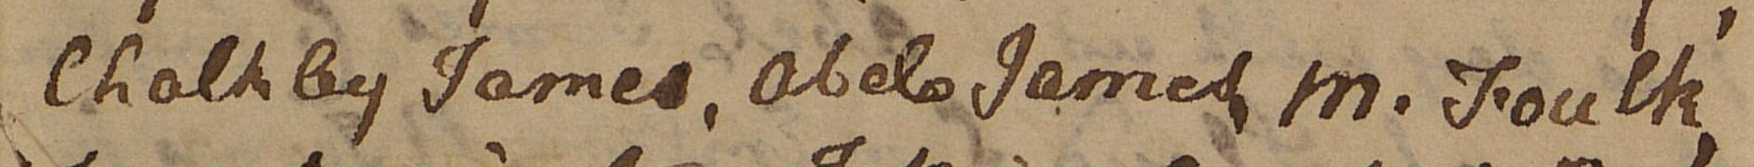Chalkley James, Abel James, M. Foulk,
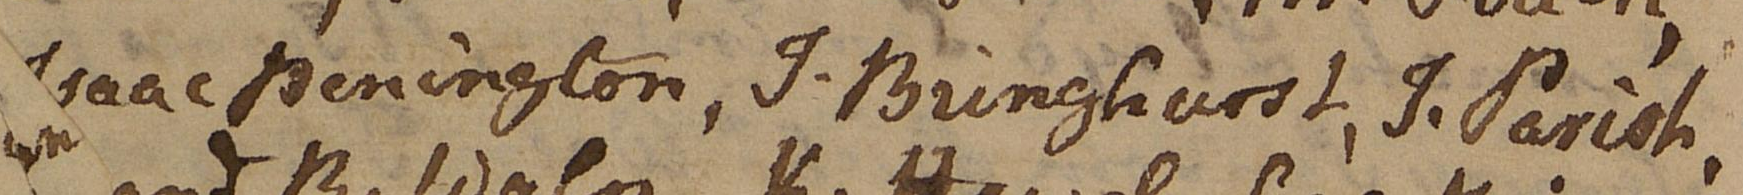Isaac Penington, J. Bringhurst, J. Parish
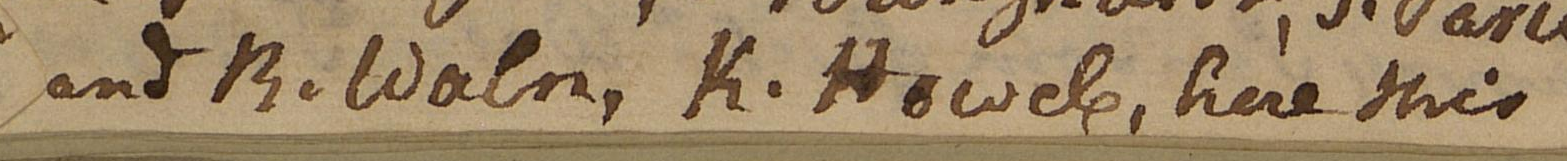and R. Waln, K. Howel, here this
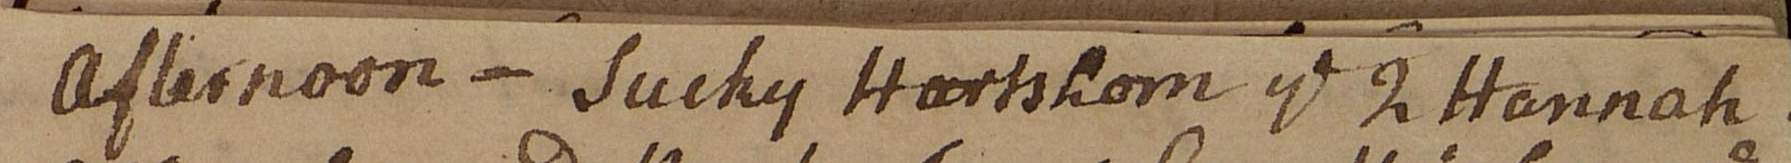Afternoon- Sucky Hartshorn y^e 2 Hannah
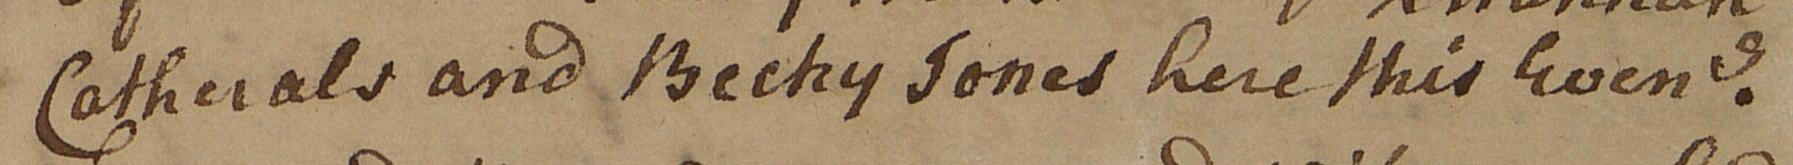Catherals and Becky Jones here this Even^g.
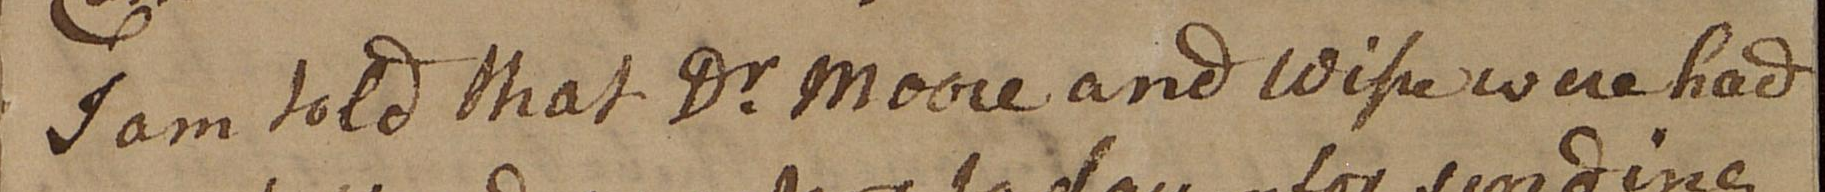I am told that D^r. Moore, and Wife were had
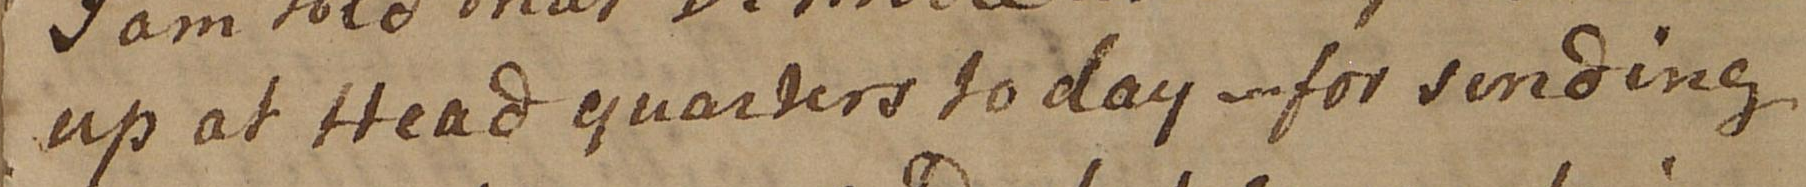up at Head quarters to day- for sending
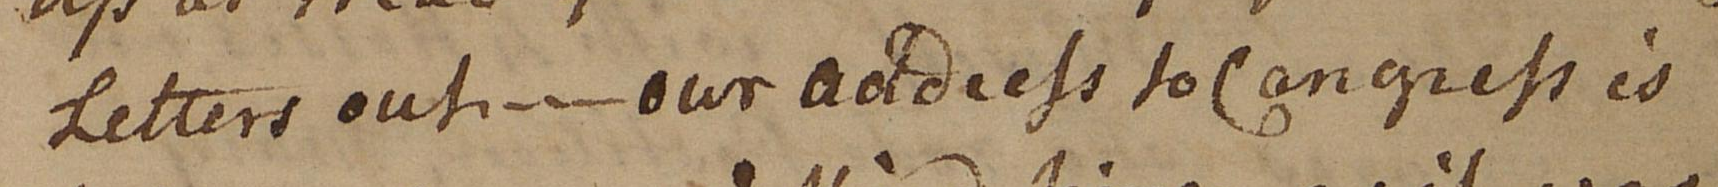Letters out- our address to Cangress is
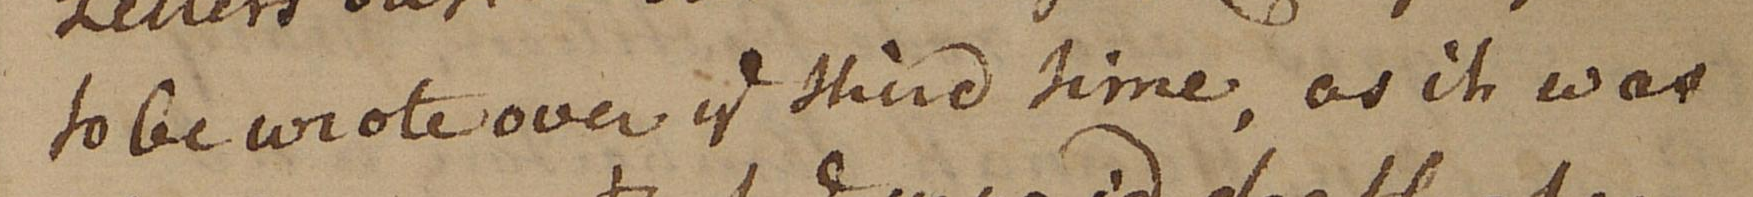to be wrote over y^e third time, as it was
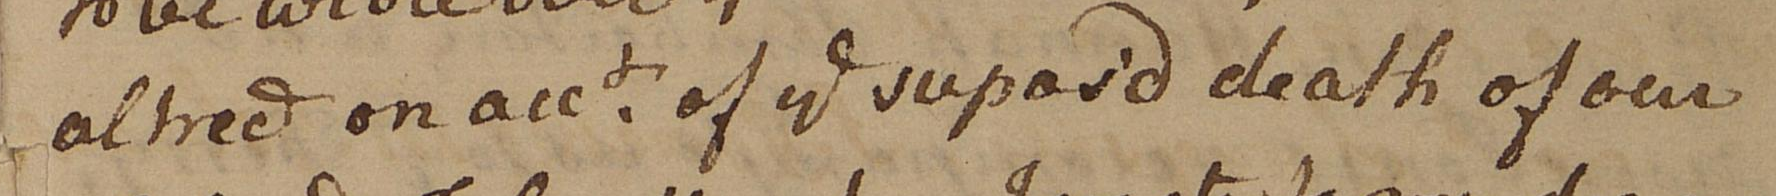altred on acc^t. of y^ supos'd death of our
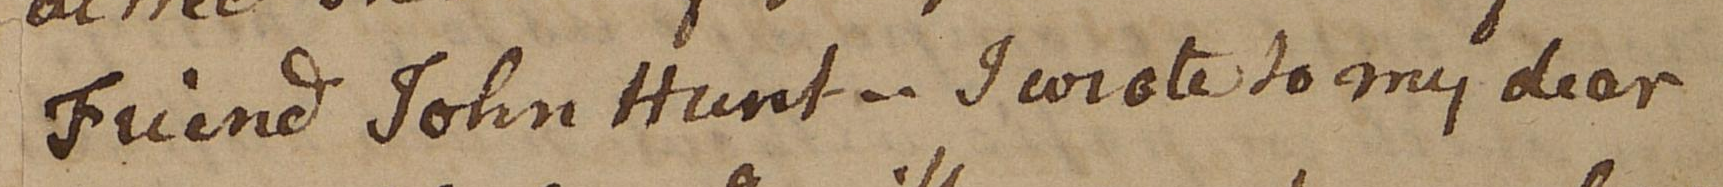Friend John Hunt- I wrote to my dear
